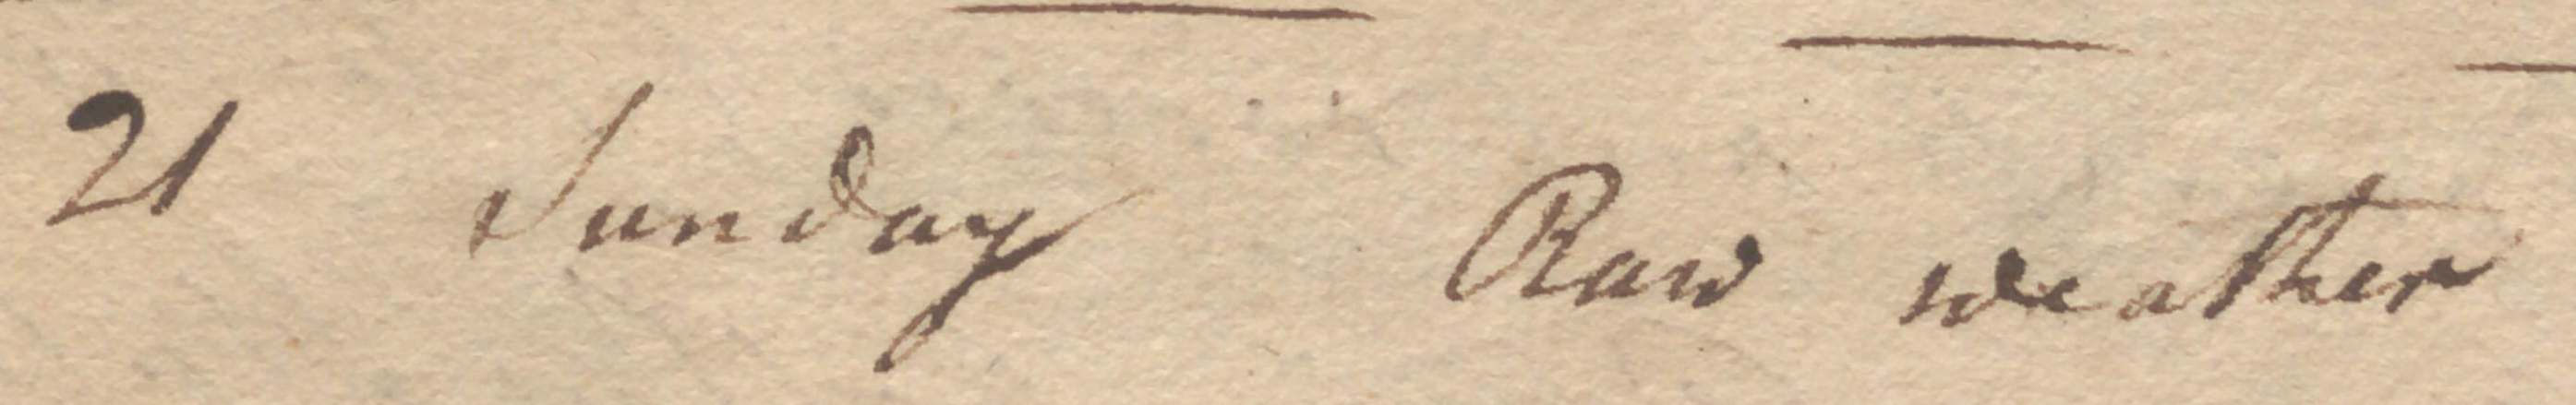21 Sunday Raw weather
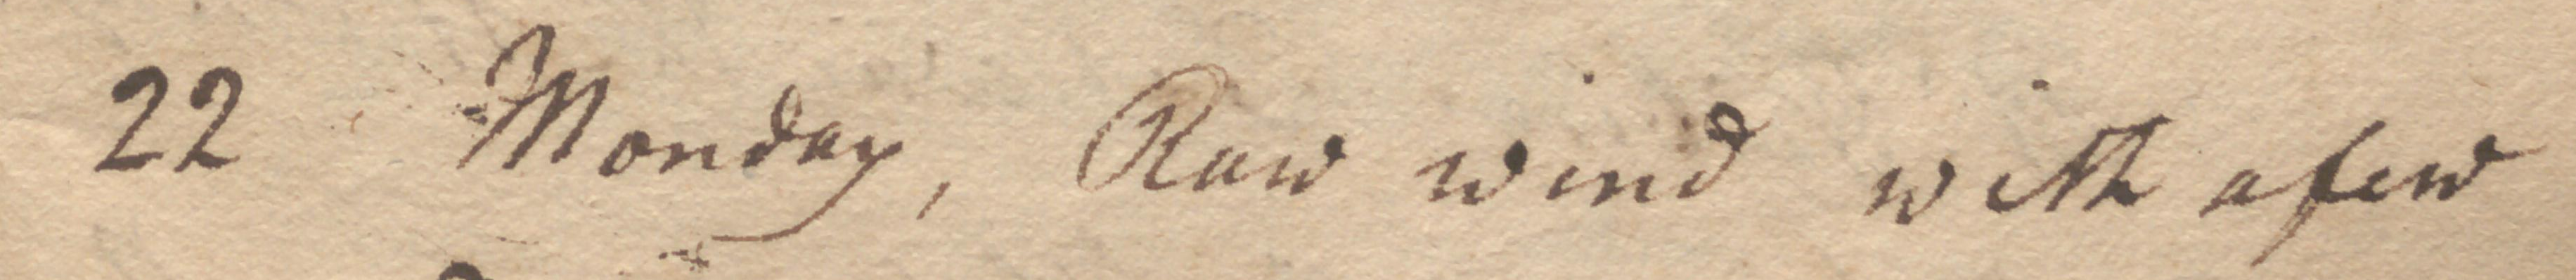22 Monday, Raw wind with a few
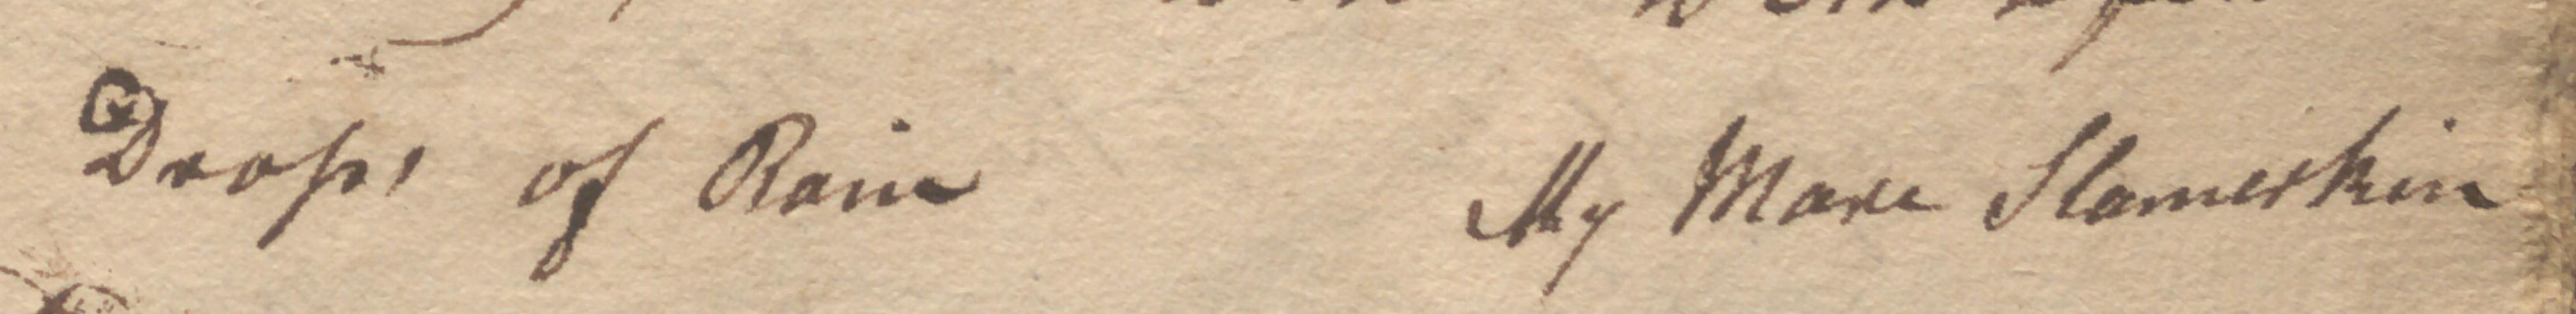Drops of Rain My Mare Slamerkin
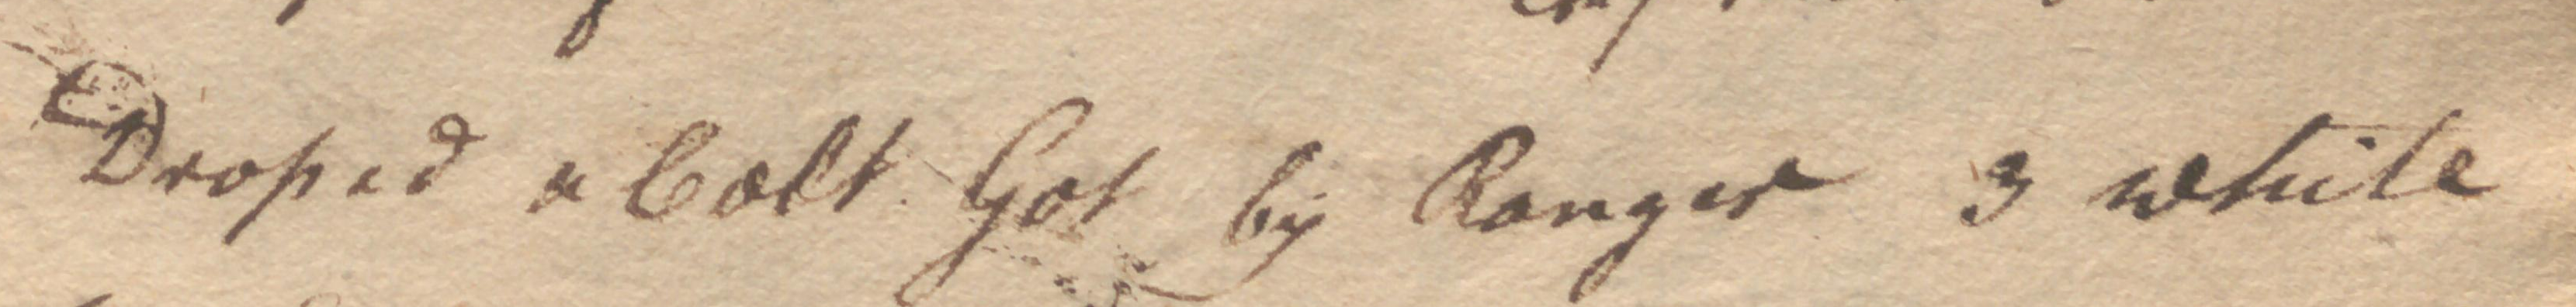Droped a Colt Got by Ranger 3 white
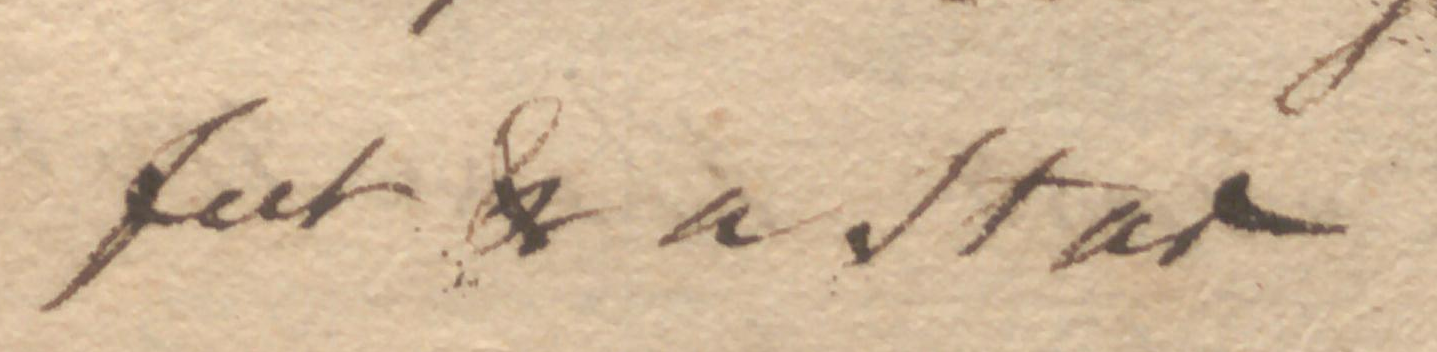feet & a Star
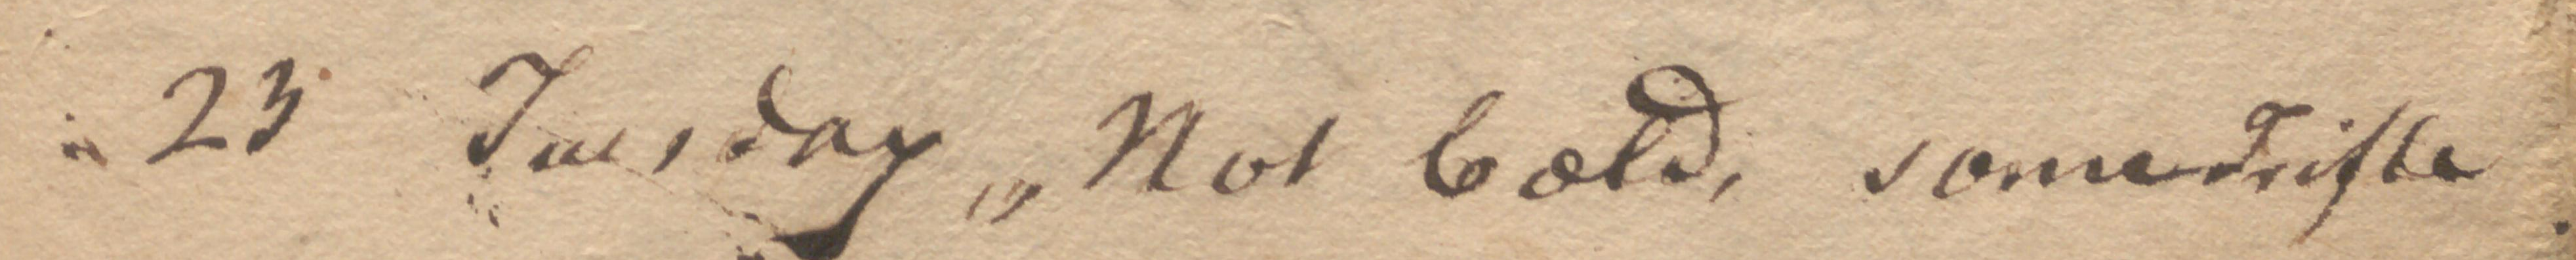23 Tuesday, Not Cold, some Trifle
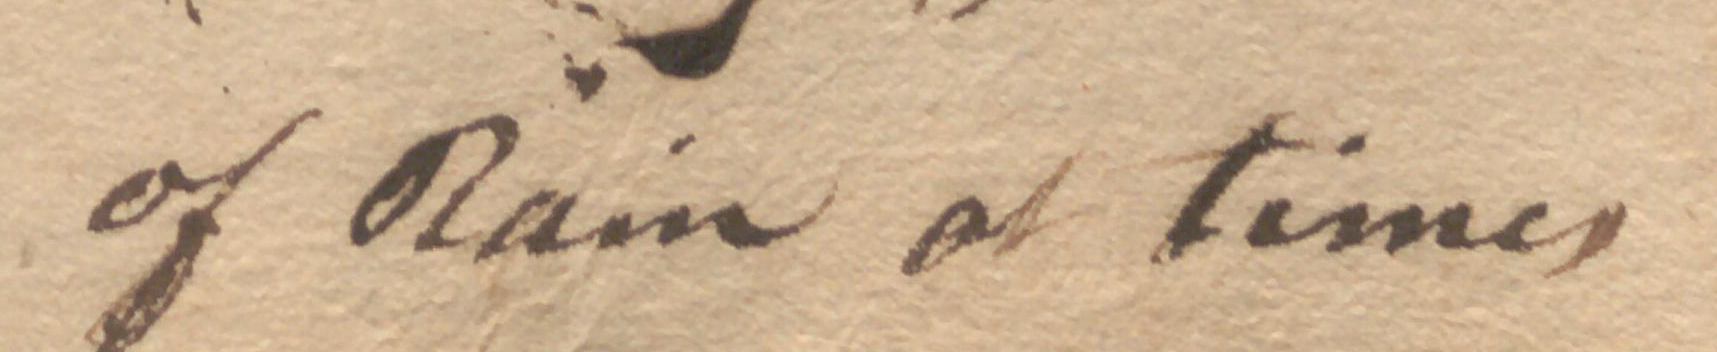of Rain at times
